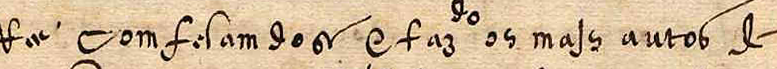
Fee comfesamdose e fazdo os majs autos de
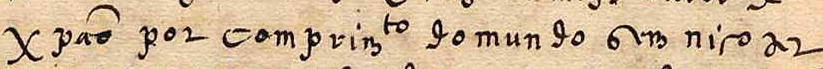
Xpão por comprimto do mundo sem niso ter
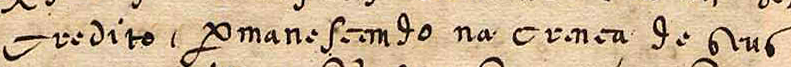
credito, ꝑmaneseemdo na crença de seus
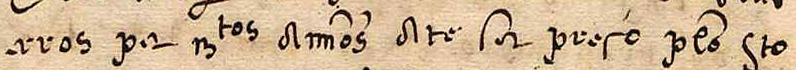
erros por mtos Ann̄os Ate ser preso pl̄o Sto
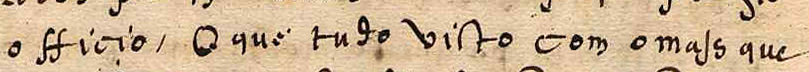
officio / E que tudo visto com o maJs que
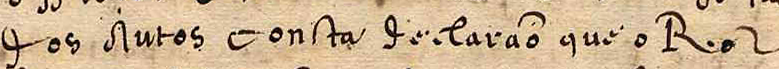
dos Autos consta declarão que o Reo
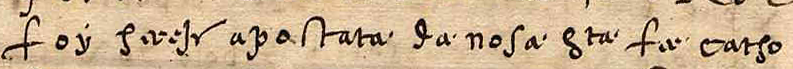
foy hereJe apostata da nosa Sta fee catho
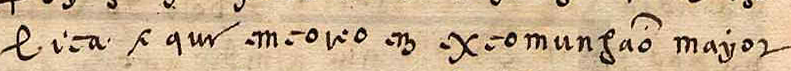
lica e que emcoreo em excomunhão mayor
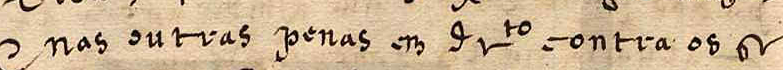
e nas outras penas em drto contra os se
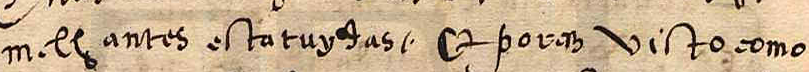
melhantes estatuydas /. E porem visto como
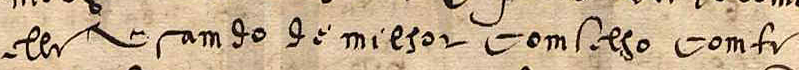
elle vsamdo de milhor comselho comfe
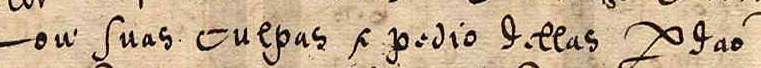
sou suas culpas e pedio dellas ꝑdaõ
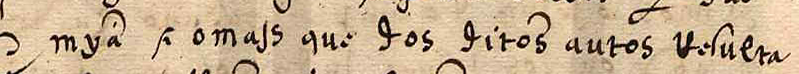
e mȳa e o majs que dos ditōs autos Resulta
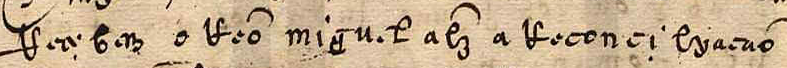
Recebem o Reō miguel al̄z a Reconcilyaçaõ
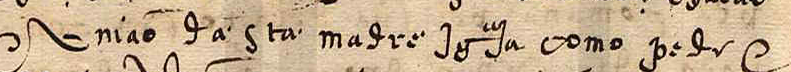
e vniaõ da sta madre JgreJa como pede e
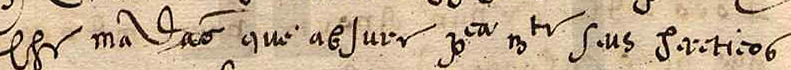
lhe mādaõ que abJure pcamte seus hereticos
